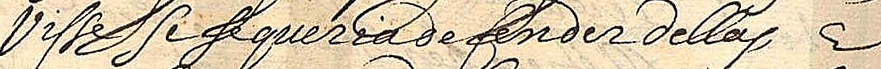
Visse se se queria defender dellas, E
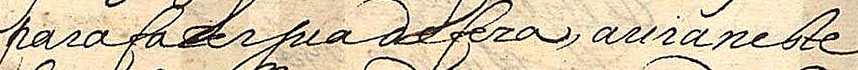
para fazer sua defeza, auia neste
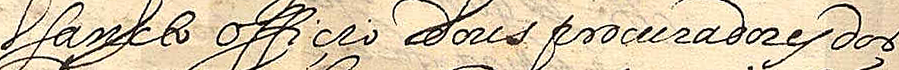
Sancto offiçio dous procuradores dos
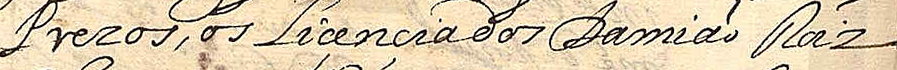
Prezos, os Liçençiados Damião Roi̅z
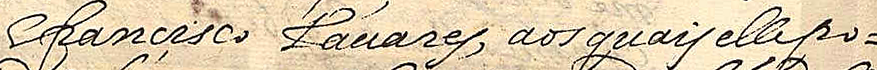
E françisco Tauares, aos quais elle po
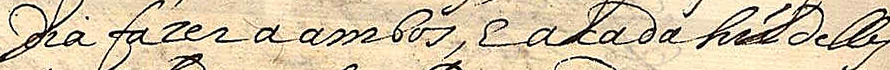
dia fazer a ambos, E a cada hu̅ delles
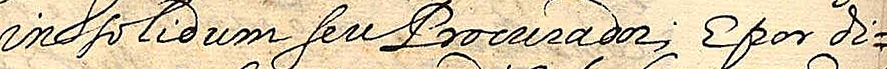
in solidum seu Procurador; E por di
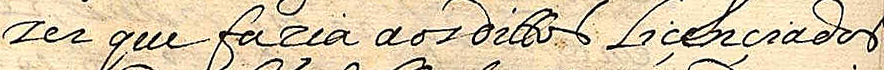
zer que fazia aos dittos Liçençiados
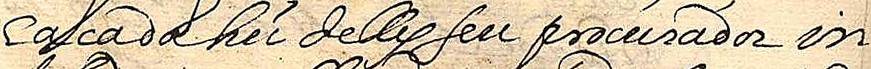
E a cada hu̅ delles seu procurador in
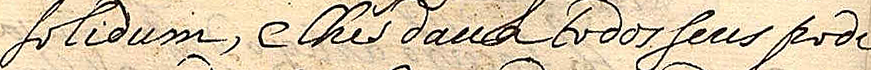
solidum, e lhes daua todos seus pode
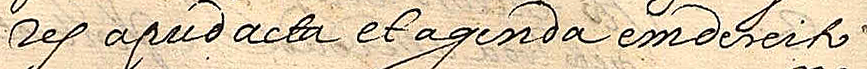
res apud acta et agenda em dereito
